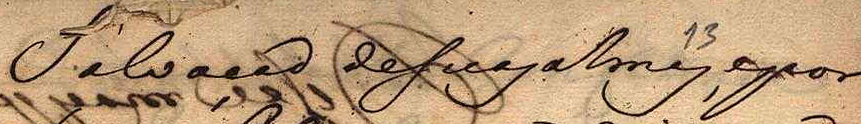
Salvaçaõ de suas almas, e por
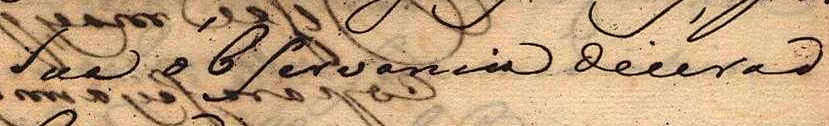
sua observançia diceraõ
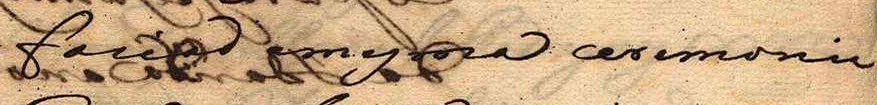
faziaõ a mesma ceremonia
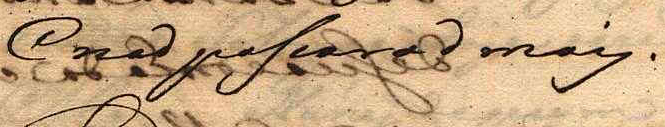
E naõ passaraõ mais.
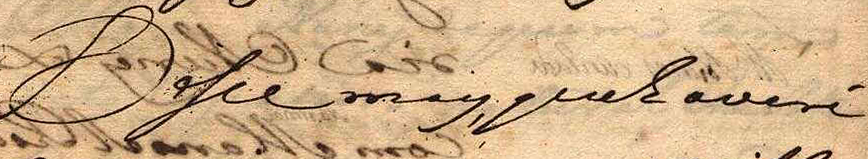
Disse mais que haverá
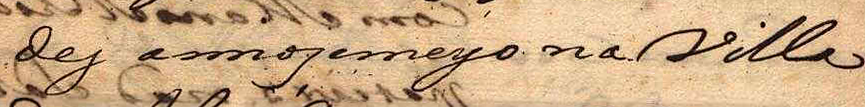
des annos e meyo na Villa
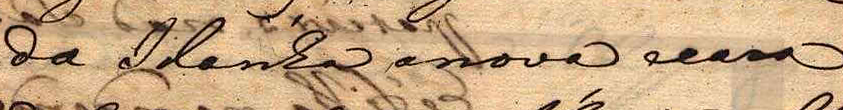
da Idanha a nova, e caza
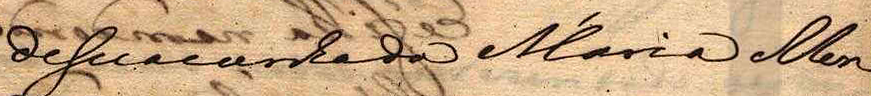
de sua cunhada Maria Men
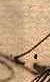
L.
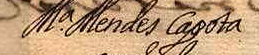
M.a Mendes Capota
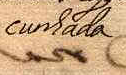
cunhada
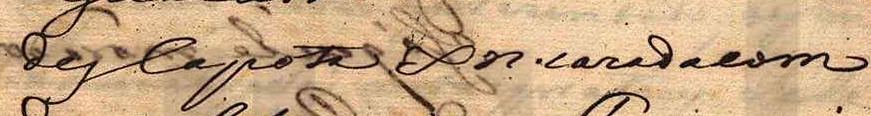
des Capota x n. cazada com
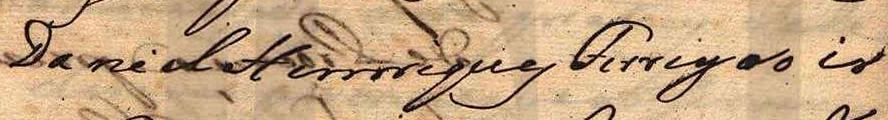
Daniel Henrriques Ferreyro ir
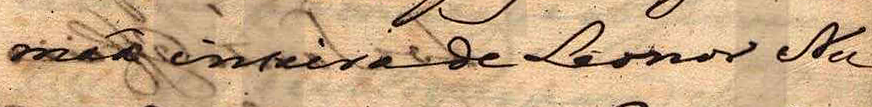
maõ inteiro de Leonor Nu
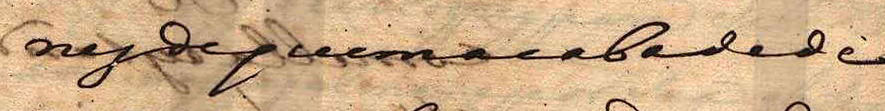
nes de quem acaba de di
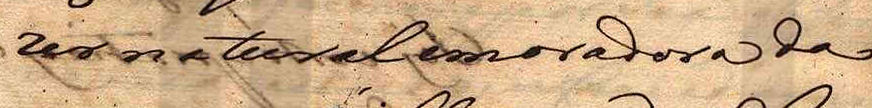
zer natural e moradora da
